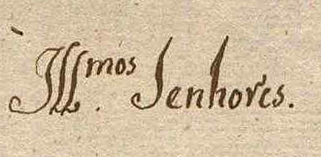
Ill.mos Senhores.
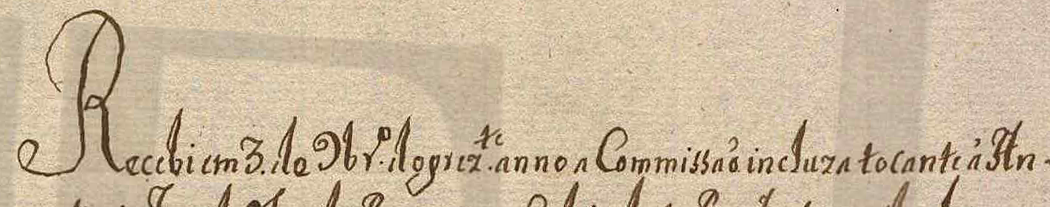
Recebi em 3. do 9br.o do prez.te anno a Commissaõ incluza tocante à An
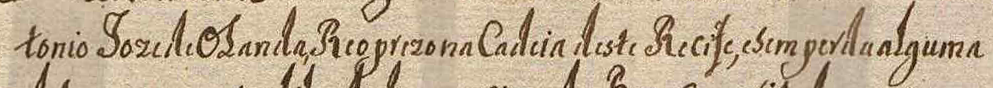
tonio Ioze de OLanda, Reo prezo na Cadeia deste Recife, e sem perda alguma
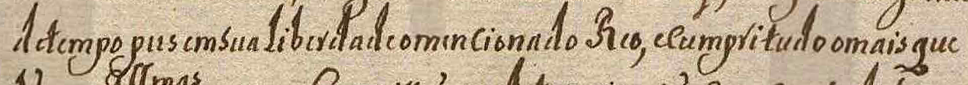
de tempo pus em sua Liberdade o mencionado Reo, e cumpri tudo o mais que
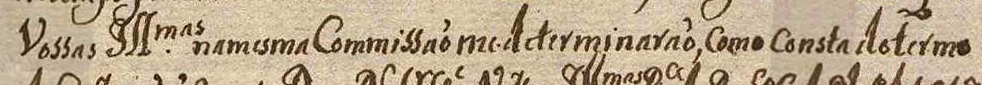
Vossas Ill.mas na mesma Commissaõ me determinaraõ, como consta do termo
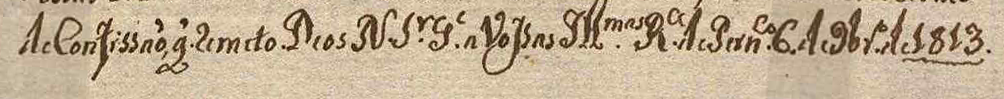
de Confissaõ, q̄ Remeto Deos N. S.r G.e a Vossas Ill.mas R.ce de Pern.co 6. de 9br.o de 1813.
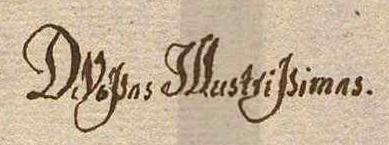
De Vossas Illustrissimas.
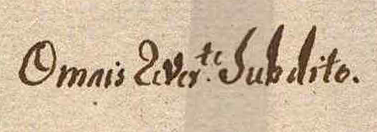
O mais Rever.te Subdito.
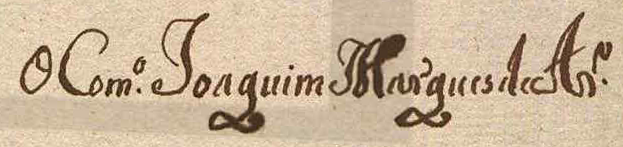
O Com.o Ioaquim Marques de Ar.o
